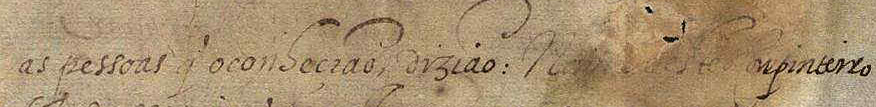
as pessoas q̄ o conhecião dizião: Nam _ este Carpinteiro
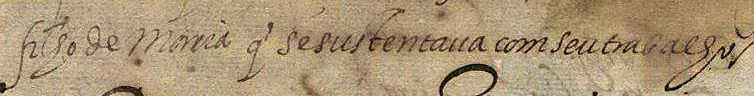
filho de maria q̄ se sustentaua com seu trabalho /
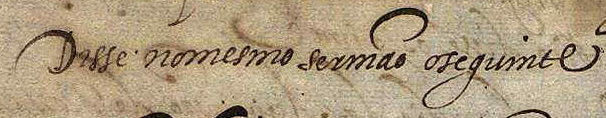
Disse no mesmo sermão o seguinte
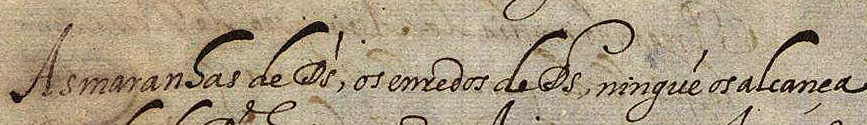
As maranhas de Ds̄, os enredos de Ds̄ ninguē os alcança
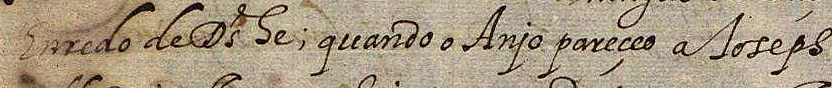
Enredo de Ds̄ he; quando o Anjo pareceo a Ioseph
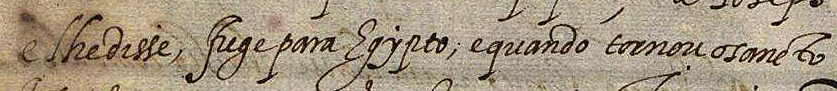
e lhe disse, fuge para Egypto, e quando tornou o sancto
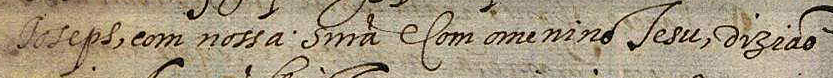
Ioseph, com nossa Snrā e Com o menino Iesu, dizião
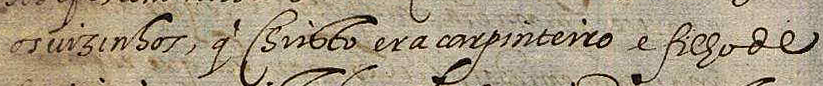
os uizinhos, q̄ Christo era carpinteiro e filho de
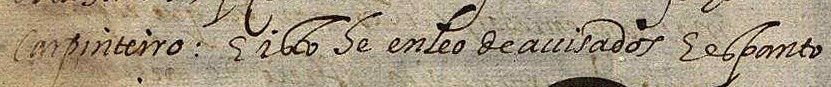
carpinteiro: E isto he enleo de auisados E espanto
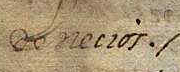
de necios. /
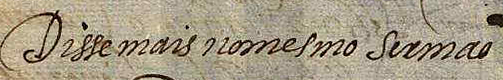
Disse mais no mesmo sermão
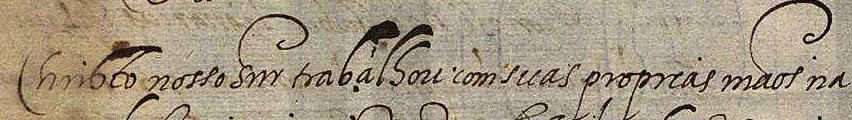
Christo nosso s̄nr trabalhou com suas proprias mãos na
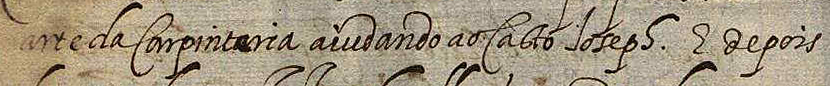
arte da Carpintaria aiudando ao Casto Ioseph. E depois
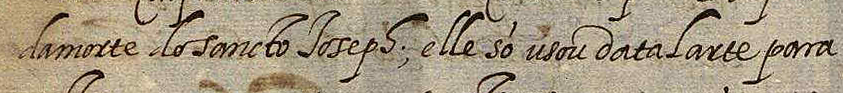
da morte do sancto Ioseph; elle só usou da tal arte para
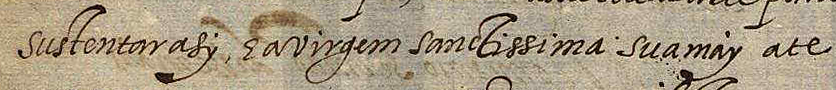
sustentar a sy E a virgem sanctissima sua may ate
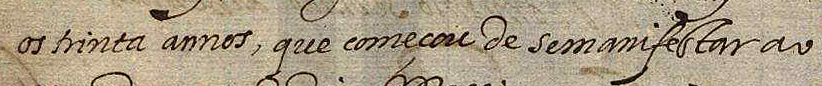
os trinta annos, que começou de se manifestar ao
